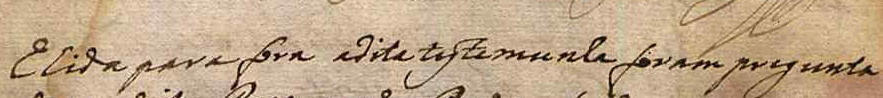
E hida para fora a dita testemunha foram pregunta
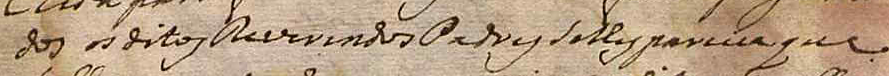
dos os ditos Reverendos Padres se lhes parecia que
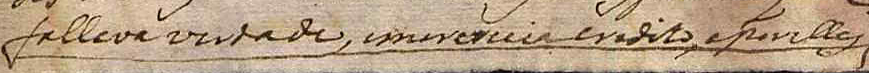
fallava verdade, e mererecia credito, e por elles
